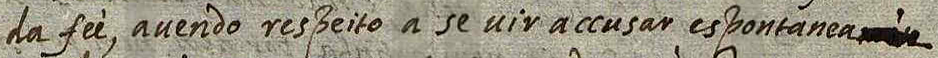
da feè, auendo respeito a se uir accusar espontaneamēte
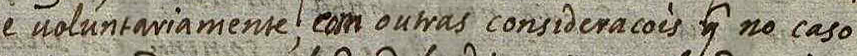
e uoluntariamente, com outras consideraçoĩs q̄ no caso
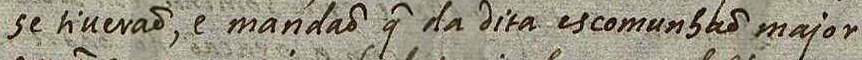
se tiueraõ, e mandaõ q̄ da dita escomunhaõ major
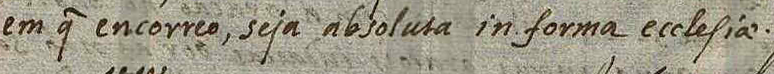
em q̄ encorreo, seja absoluta in forma ecclesiæ.
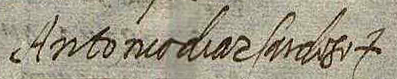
Antonio diaz Cardoso
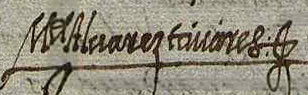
Mel Aluarez tauares
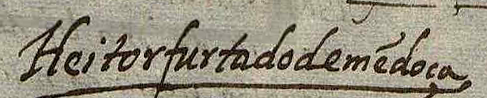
Heitor furtado de mēdoça
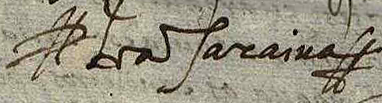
Ioaõ saraiua
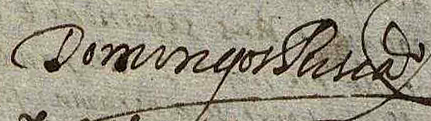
Domingos Riscado
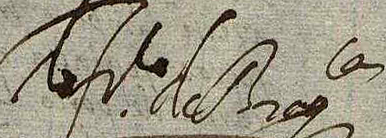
d̄. fr.co de Bragça
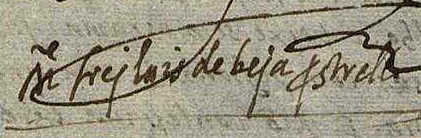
Me frei luis de beja ꝓstrello
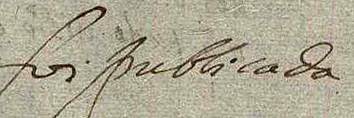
foi publicada
